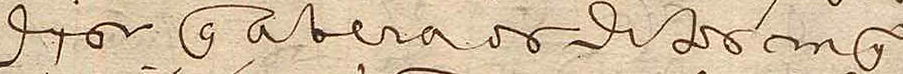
djse q̄ avera os ditos cinq̄o
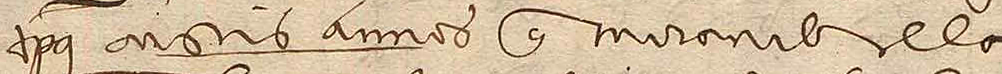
ou seis annos q̄ morando ella
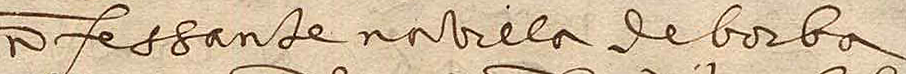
cōfessante na villa de borba
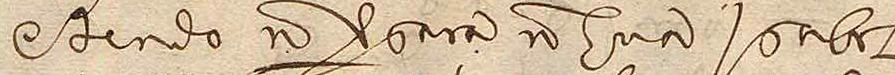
e tendo cōꝟsação cō huā JsabeL
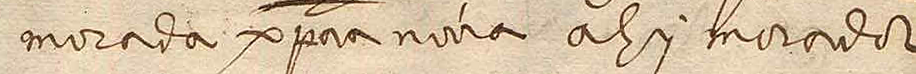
morada xp̄aa noua ahy morador
